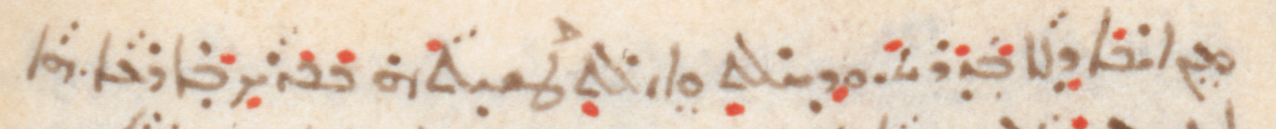ܡܢ ܐܝܟܐ ܕܠܐ ܒܕܪܬ: ܘܕܚܠܬ ܘܐܙܠܬ ܛܫܝܬܗ̇ ܟܟܪܟ ܒܐܪܥܐ ܗܐ
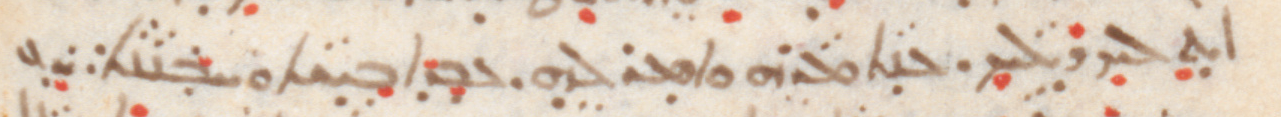ܐܝܬ ܠܟ ܕܝܠܟ. ܥܢ̣ܐ ܡܪܗ ܘܐܡ̣ܪ ܠܗ. ܥܒܕܐ ܒܝܫܐ ܘܚܒܢܢܐ: ܝ̇ܕܥ
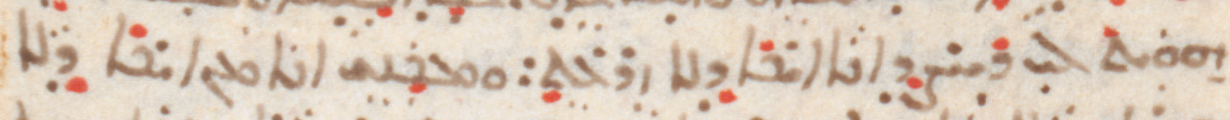ܗܘܝܬ ܠܝ ܕܚ̇ܨܕ ܐܢܐ ܐܝܟܐ ܕܠܐ ܙܪܥܬ: ܘܡܟܢܫ ܐܢܐ ܡܢ ܐܝܟܐ ܕܠܐ
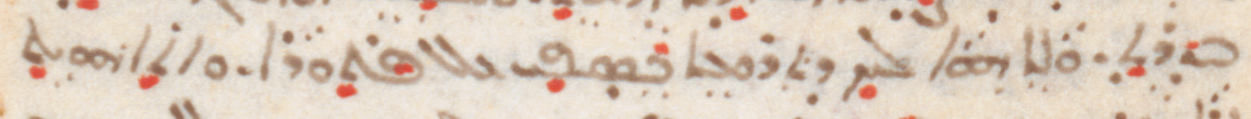ܒܕܪܬ. ܘܠܐ ܗܘܐ ܠܟ ܕܬܪܡܐ ܟܣܦܝ ܥܠ ܦܬܘܪܐ. ܘܐܬܐ ܗܘܝܬ
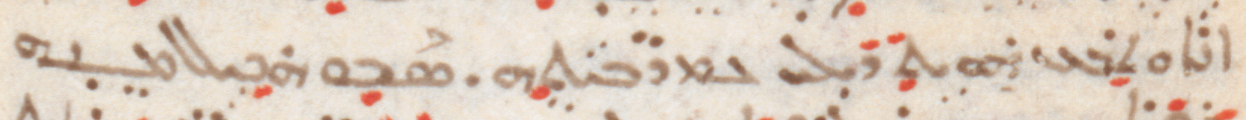ܐܢܐ ܘܬܒ̇ܥ ܗܘܝܬ ܕܝܠܝ ܥܡ ܪܒܝܬܗ. ܣܒܘ ܗܟܝܠ ܡܢܗ
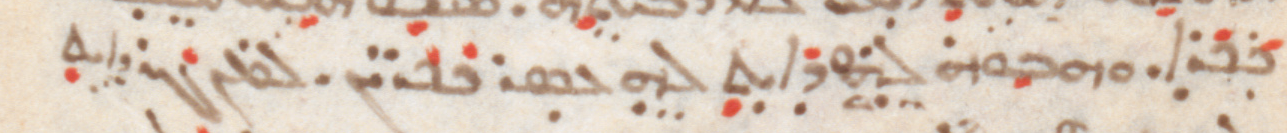ܟܒܪܐ. ܘܗܒܘܗ̇ ܠܗ̇ܘ ܕܐܝܬ ܠܗ ܥܣ̣ܪ ܟܟܪ̈ܝܢ. ܠܡ̇ܢ ܓܝܪ:
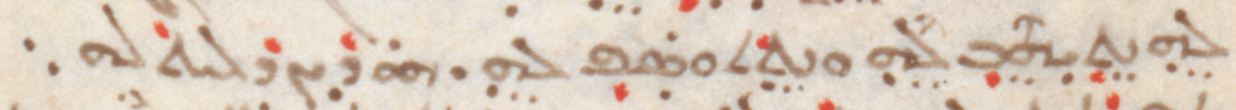ܠܗ ܢܬܝܗܒ ܠܗ ܘܢܬܬܘܣܦ ܠܗ. ܗ̇ܘ ܕܝܢ ܕܠܝܬ ܠܗ܆
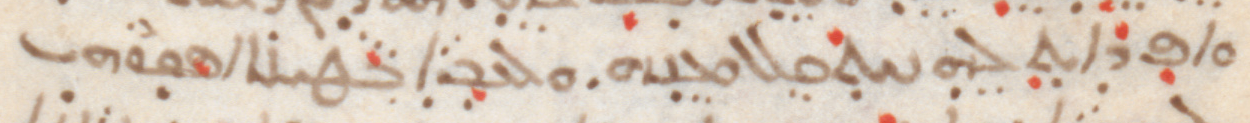ܘܐܦ ܕܐܝܬ ܠܗ ܢܫܬܩܠ ܡܢܗ. ܘܠܥܒܕܐ ܒܛܝܠܐ ܐܦܩܘܗܝ
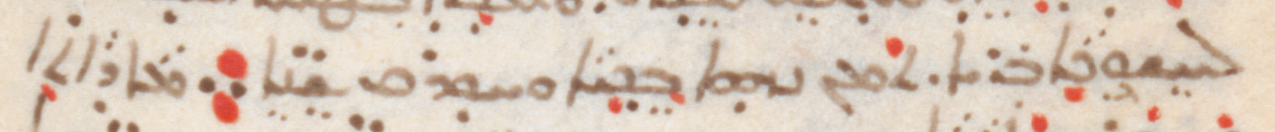ܠܚܫܘܟܐ ܒܪܝܐ. ܬܡܢ ܢܗܘܐ ܒܟܝܐ ܘܚܘܪܩ ܫܢ̈ܐ܀ ܡܐ ܕܐܬܐ
